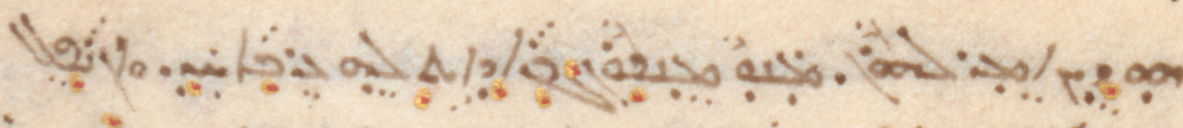ܗ̣ܘ ܕܝܢ ܐܡ̣ܪ ܠܗܘܢ. ܡܢܘ ܡܢܟܘܢ ܓܒܪܐ ܕܐܝܬ ܠܗ ܥܪܒܐ ܚܕ. ܘܐܢ ܢܦ̣ܠ
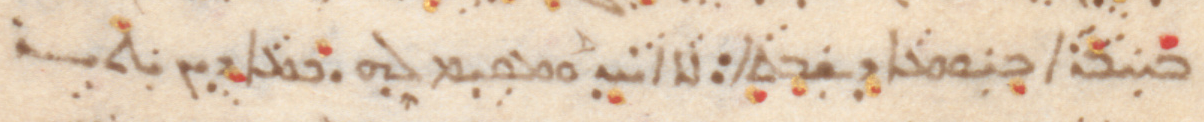ܒܚܒܪܐ ܒܝܘܡܐ ܕܫܒܬܐ: ܠܐ ܐܚܕ ܘܡܩܝܡ ܠܗ. ܟܡܐ ܕܝܢ ܝܬܝܪ
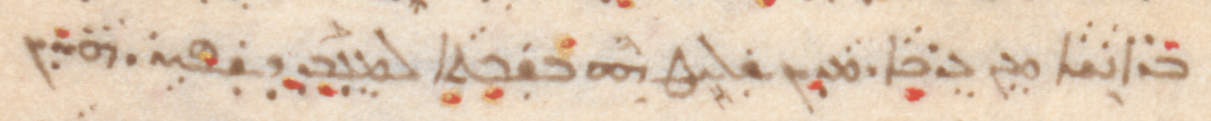ܒܪܐܢܫܐ ܡ̣ܢ ܥܪܒܐ. ܡܕܝܢ ܫܠܝܛ ܗܘ ܒܫܒܬܐ ܠܡܥܒܕ ܕܫܦܝܪ. ܗܝܕܝܢ
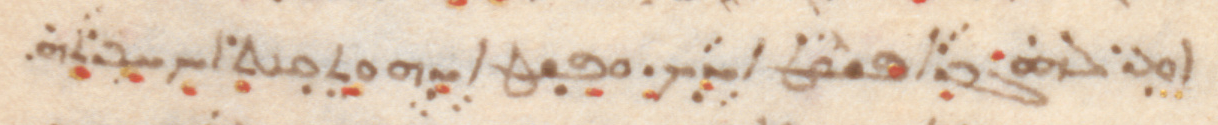ܐܡ̣ܪ ܠܗ̇ܘ ܓܒܪܐ ܦܫܘܛ ܐܝܕܝܟ. ܘܦܫܛ ܐܝܕܗ ܘܬܩܢܬ ܐܝܟ ܚܒܪܬܗ̇.
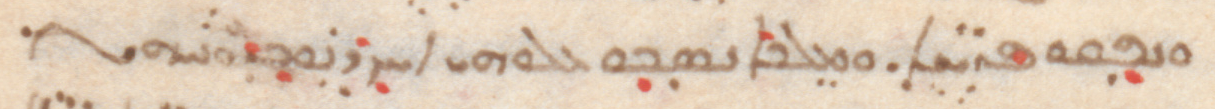ܘܢܦ̣ܩܘ ܦܪ̈ܝܫܐ. ܘܡܠܟܐ ܢܣ̣ܒܘ ܥܠܘܗܝ ܐܝܟ ܕܢܘܒܕܘܢܝܗܝ.
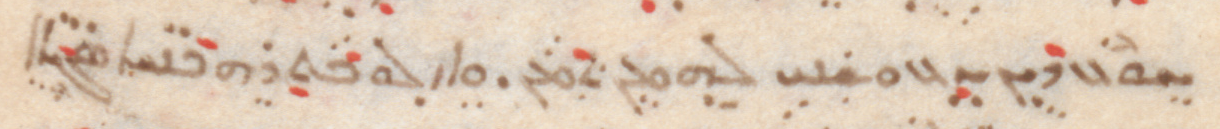ܝܫܘܥ ܕܝܢ ܝܕܥ ܘܫܢܝ ܠܗ ܡ̣ܢ ܬܡܢ. ܘܐܙ̣ܠܘ ܒܬܪܗ ܟܢ̈ܫܐ ܣ̈ܓܝܐܐ
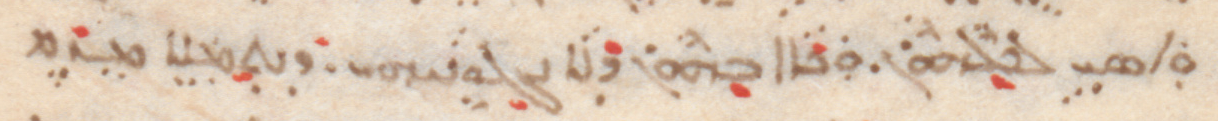ܘܐܣܝ ܠܟܠܗܘܢ. ܘܟܐܐ ܒܗܘܢ ܕܠܐ ܢܓܠܘܢܝܗܝ. ܕܢܬܡܠܐ ܡܕܡ
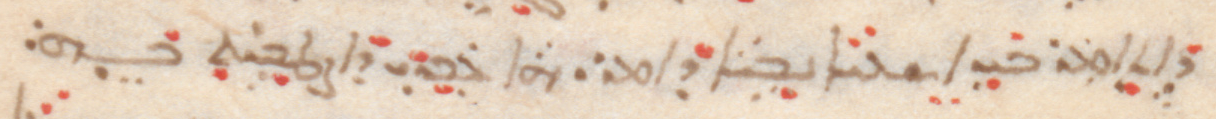ܕܐܬܐܡ̣ܪ ܒܝܕ ܐܫܥܝܐ ܢܒܝܐ ܕܐܡܪ. ܗܐ ܥܒܕܝ ܕܐܛܒܝܬ ܒܗ:
